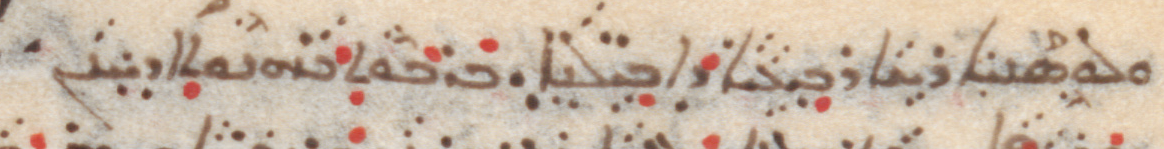ܘܠܘܣܢܝܐ ܪܝܫܐ ܪܒܝܥܝܐ ܕܐܒܝ̈ܠܢܐ܆ ܒܪܒܘܬ ܟܗܢܘܬܐ ܕܚܢܢ
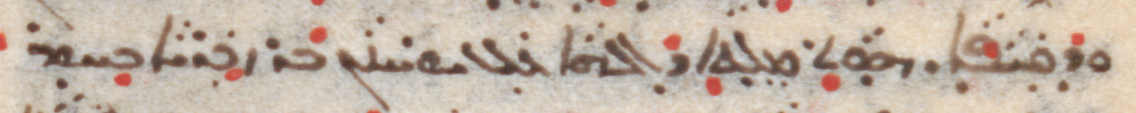ܘܕܩܝܦܐ܆ ܗܘ̣ܬ ܡܠܬܐ ܕܐܠܗܐ ܥܠ ܝܘܚܢܢ ܒܪ ܙܟܪܝܐ ܒܚܘܪ
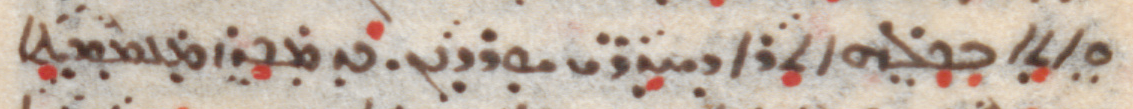ܘܐܬܐ ܒܟܠܗ ܐܬܪܐ ܕܚܕܪ̈ܝ ܝܘܪܕܢܢ. ܟܕ ܡܟܪܙ ܡܥܡܘܕܝܬܐ
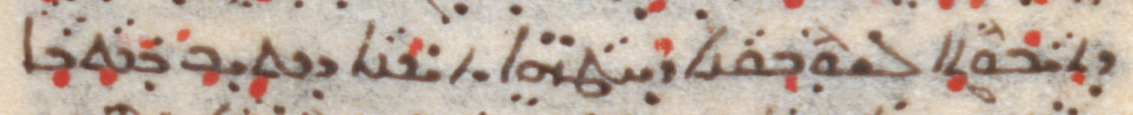ܕܬܝܒܘܬܐ ܠܫܘܒܩܢܐ ܕܚܛܗ̈ܐ. ܐܝܟܢܐ ܕܟܬܝܒ ܒܟܬܒܐ
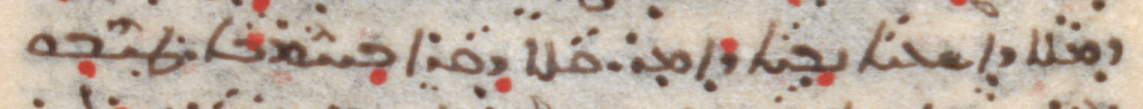ܕܡ̈ܠܐ ܕܐܫܥܝܐ ܢܒܝܐ ܕܐܡ̣ܪ. ܩܠܐ ܕܩܪܐ ܒܚܘܪܒܐ ܛܝܒܘ
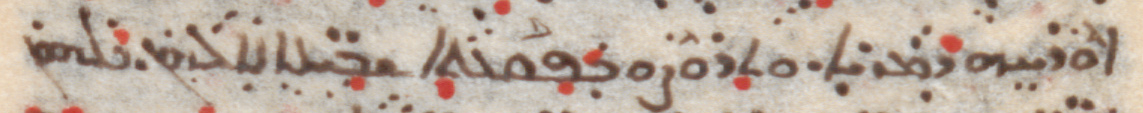ܐܘܪܚܗ ܕܡܪܝܐ܆ ܘܬܪܘܨܘ ܒܦܩܥܬܐ ܫܒ̈ܝܠܐ ܠܐܠܗܢ. ܟܠܗܘܢ
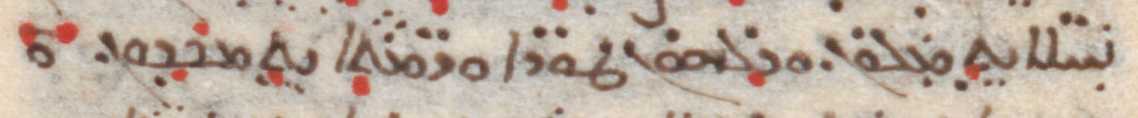ܢܚ̈ܠܐ ܢܬܡܠܘܢ. ܘܟܠܗܘܢ ܛܘܪ̈ܐ ܘܪ̈ܘܡܬܐ ܢܬܡܟܟܘܢ. ܏ܘ
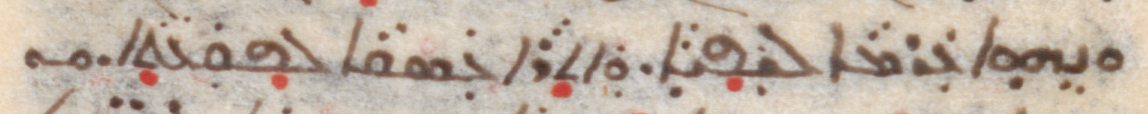ܘܢܗܘܐ ܥܪܡܐ ܠܫܦܝܐ܆ ܘܐܬܪܐ ܥܣܩܐ ܠܦܩܥܬܐ. ܘ
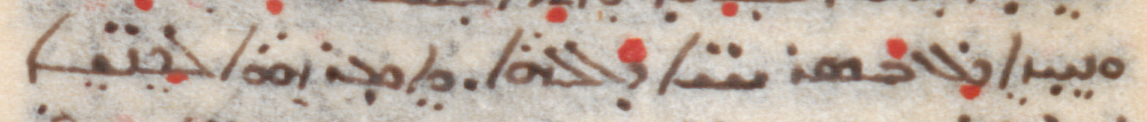ܘܢܚܙܐ ܟܠ ܒܣܪ ܚܝ̈ܐ ܕܐܠܗܐ. ܘܐܡ̣ܪ ܗܘܐ ܠܟܢ̈ܫܐ
